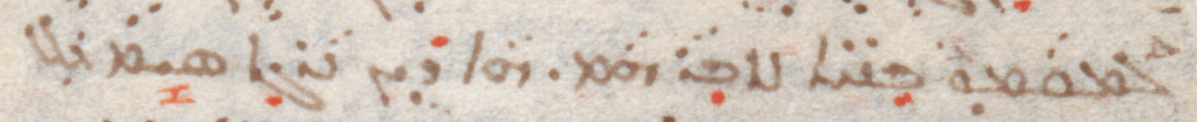ܠܡܩܡܘ ܒܢ̈ܝܐ ܠܐܒܪܗܡ. ܗܐ ܕܝܢ ܢܪܓܐ ܣܝܡ ܥܠ
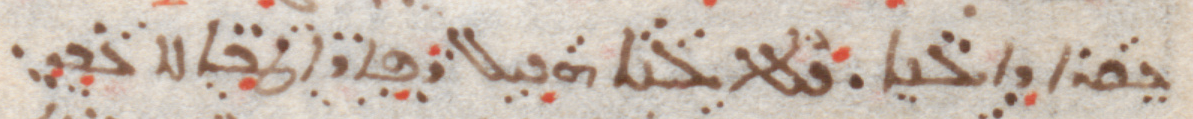ܥܩܪ̈ܐ ܕܐܝܠ̈ܢܐ. ܟܠ ܐܝܠܢܐ ܗܟܝܠ ܕܦܐܪ̈ܐ ܛܒ̈ܐ ܠܐ ܥ̇ܒܕ܉
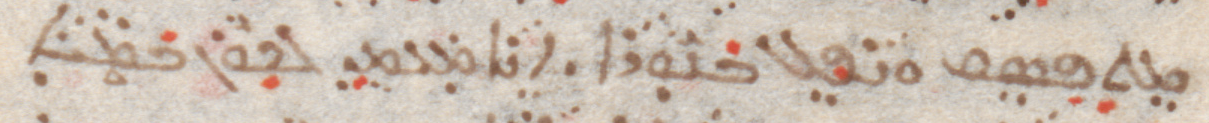ܡܬܦܣܩ ܘܢ̇ܦܠ ܒܢܘܪܐ. ܐܢܐ ܡܥܡܕ ܐܢܐ ܠܟܘܢ ܒܡ̈ܝܐ
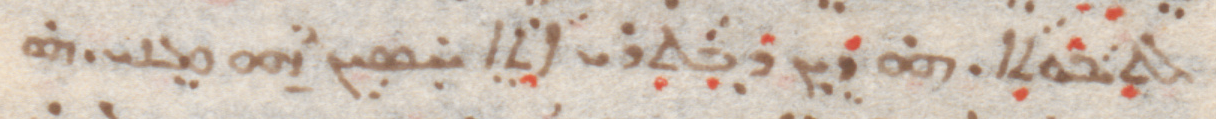ܠܬܝܒܘܬܐ. ܗ̇ܘ ܕܝܢ ܕܒܬܪܝ ܐ̇ܬܐ ܚܣܝܢ ܗܘ ܡܢܝ. ܗ̇ܘ
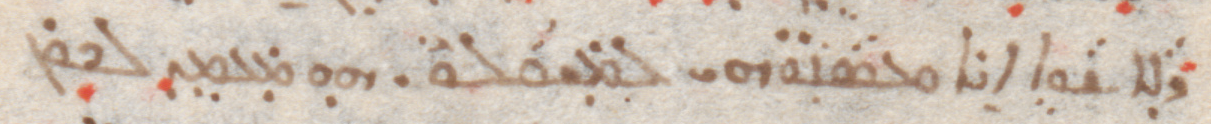ܕܠܐ ܫܘܐ ܐܢܐ ܡܣܢܘ̈ܗܝ ܠܡܫܩܠܘ .ܗ̣ܘ ܡܥܡܕ ܠܟܘܢ
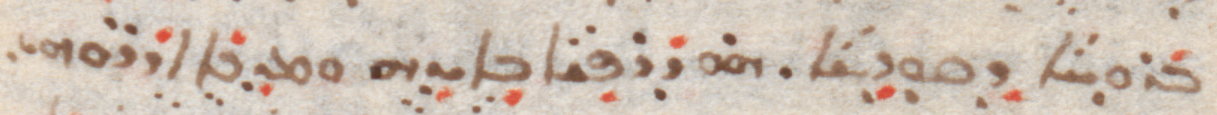ܒܪܘܚܐ ܕܩܘܕܫܐ. ܘܒܢܘܪܐ ܗܘ ܕܪܦ݂ܫܐ ܒܐܝܕܗ ܘܡܕܟܐ ܐܕܪ̈ܘܗܝ.
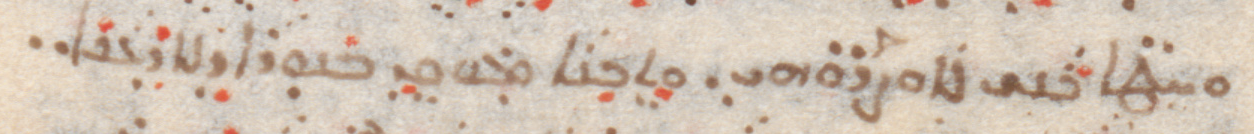ܘܚܛ̈ܐ ܟܢܫ ܠܐܘܨܪ̈ܘܗܝ܆ ܘܬܒܢܐ ܡܘܩܕ ܒܢܘܪܐ ܕܠܐ ܕܥܟܐ..
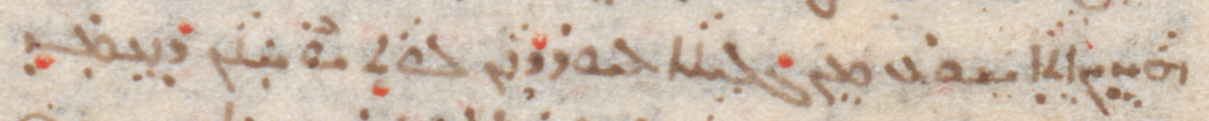ܗܝܕܝܢ ܐܬ̣ܐ ܝܫܘܥ ܡ̣ܢ ܓܠܝܠܐ ܠܝܘܪܕܢܢ ܠܘܬ ܝܘܚܢܢ ܕܢܥܡܕ
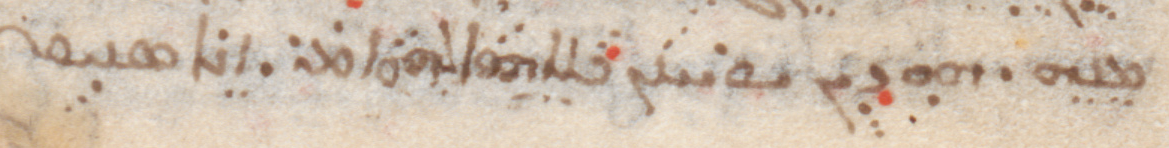ܡܢܗ. ܗ̣ܘ ܕܝܢ ܝܘܚܢܢ ܟܠܐ ܗܘܐ ܠܗ ܘܐܡ̇ܪ. ܐܢܐ ܣܢܝܩ
